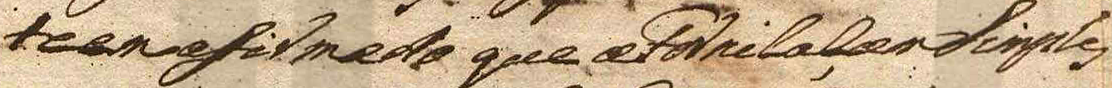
teem afirmado que a ForniCaÇam Simples
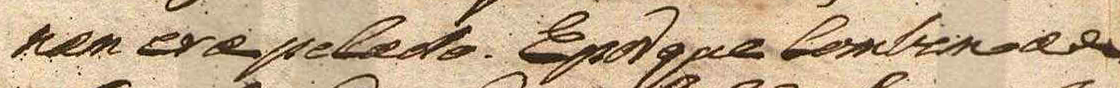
nam era peCado. E porque Comvem ao
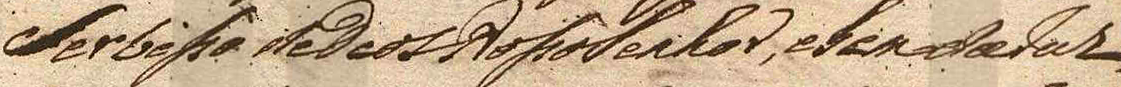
Servisso de Deos Nosso Senhor, e bem da Ius
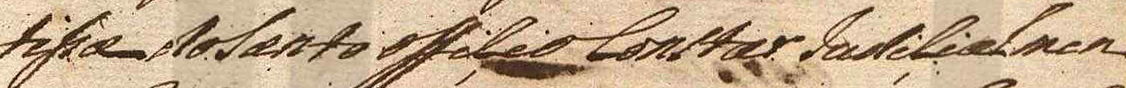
tissa do Santo offiÇio Constar IudiÇialmen
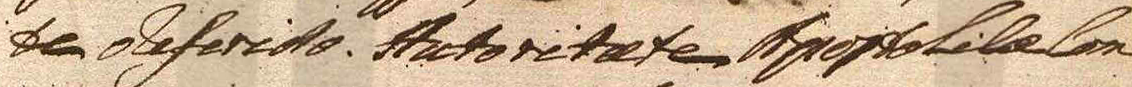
te o Referido. Autoritate ApostoLiCa Com
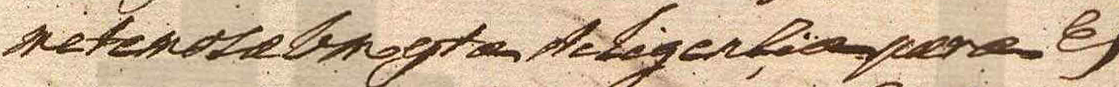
metemos a vm esta deligenÇia para Es
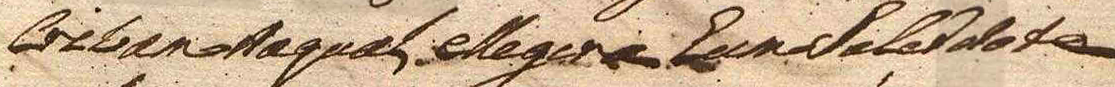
Crivam da qual ellegera hum SaÇerdote
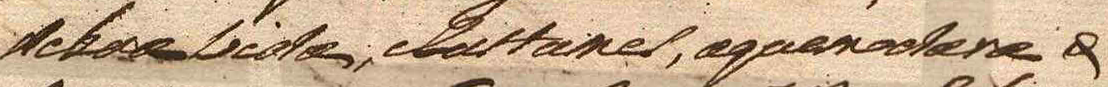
de boa vida, e Custumes, a quem dara o
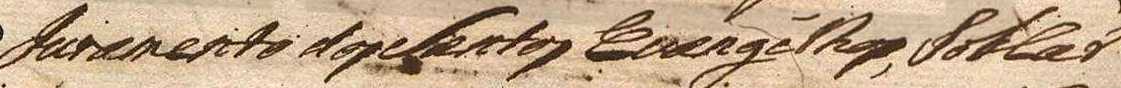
Juramento dos Santos Evangélhos, Sob Car
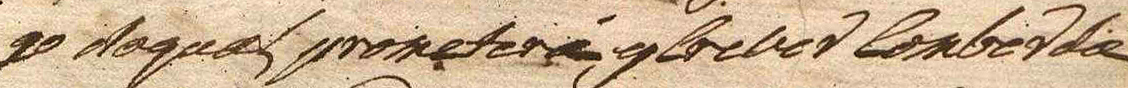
go do qual prometerá esCrever com verda
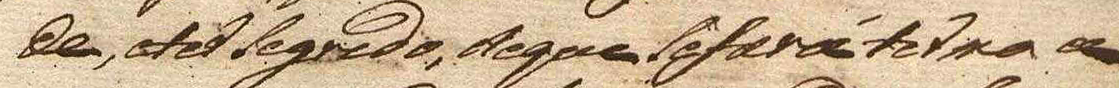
de, e ter segredo, de que se fará termo a
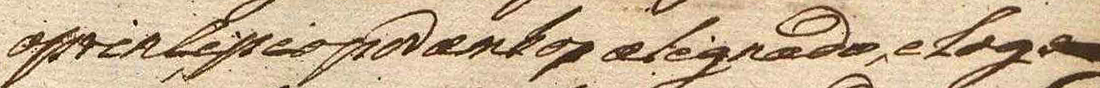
o prinÇipio por ambos asignado, e logo
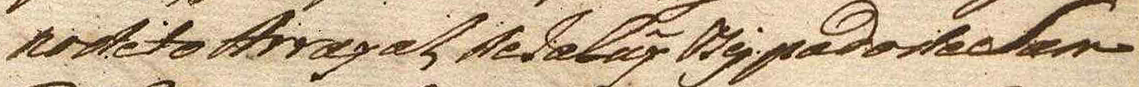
no dito ArrayaL de IaCuŷ Bispado de Sam
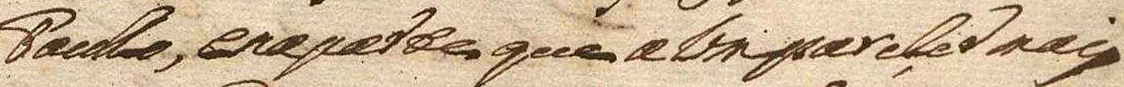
Paullo, e na parte que a Vm pareÇer mais
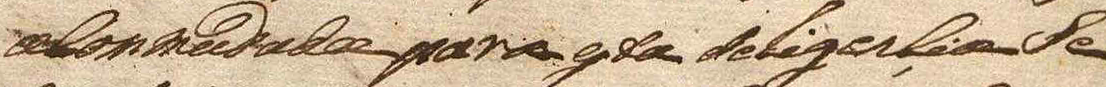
aCommodado para esta deligenÇia se
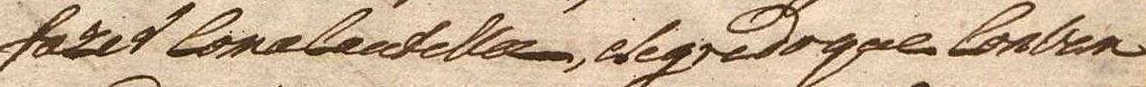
fazer Com a Cautella, segredo que Convem
